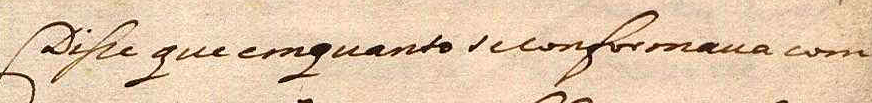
Disse que emquanto se conformaua com
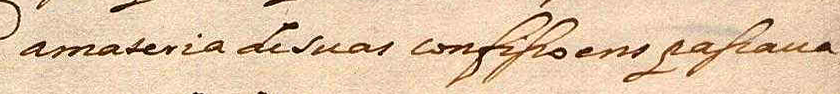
a materia de suas confissoens passaua
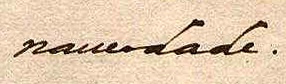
na uerdade.
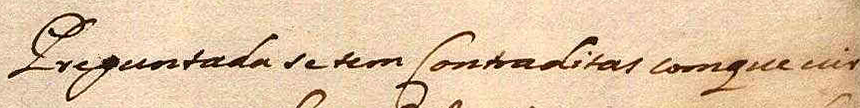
Preguntada se tem Contraditas com que uir
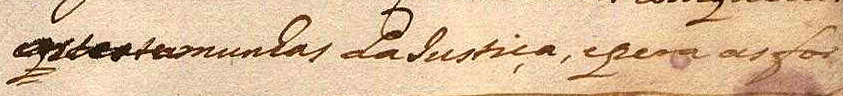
_ testemunhas da Justiça, e pera as for
